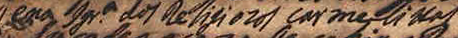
e na Jgr.a dos Religiozos carmelittas
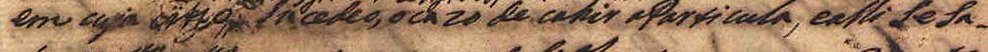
em cujo citio sucedeo, o cazo de cahir a Particula, e alli se sa
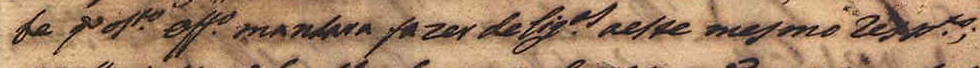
be q̄ o s.to off.o mandara fazer delig.as a este mesmo Resp.to;
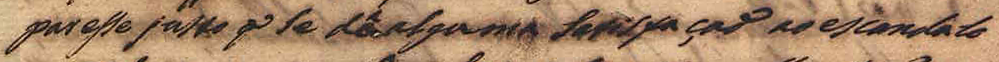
paresse justo q̄ se dê alguma satisfaçaõ ao escandalo
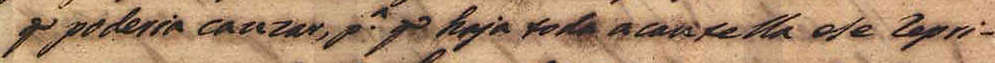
q̄ poderia cauzar, p.a q̄ haja toda a cautella e se Repri
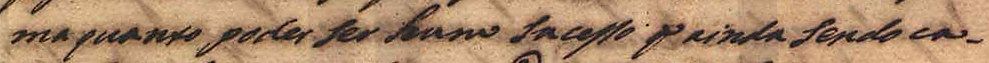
ma quanto poder ser hum Sucesso q̄ ainda sendo ca
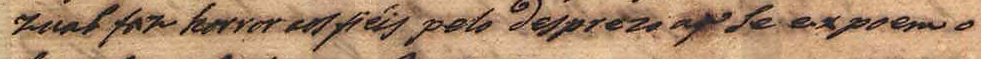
zual faz horror aos fieis pelo desprezo a q̄ se expoem o
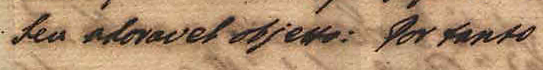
seu adoravel objetto: Portanto
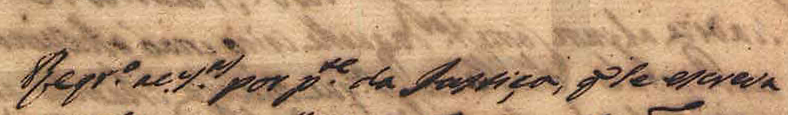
Reqr.o a v s.as por p.te da Iustiça, q̄ se escreva
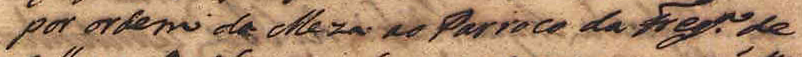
por ordem da Meza ao Parroco da Freg.a de
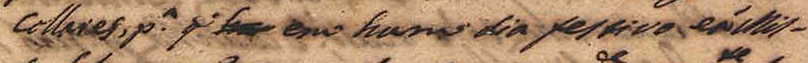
collares, p.a q̄ _ em hum dia festivo e á Mis
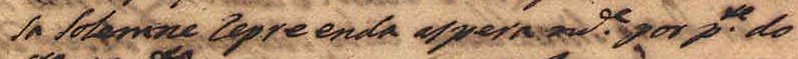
sa solemne Repreenda asperam.te por p.te do
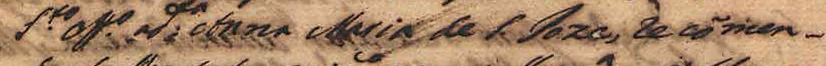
s.to off.o a d.a Anna Maria de S. Ioze, recōmen
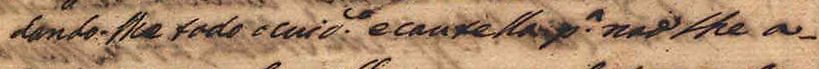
dando-lhe todo o cuid.o e cautella p.a naõ lhe a
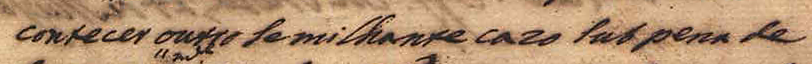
contecer outro semilhante cazo sub pena de
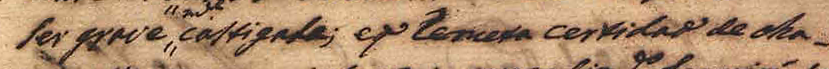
ser gravem.te castigada; e q̄ Remeta certidaõ de o ha
